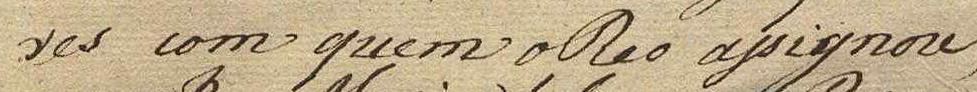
res com quem o Reo assignou
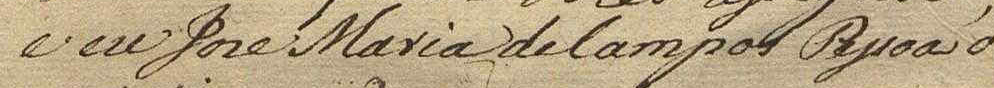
e eu Joze Maria de Campos Pessoa o
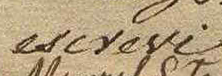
escrevi
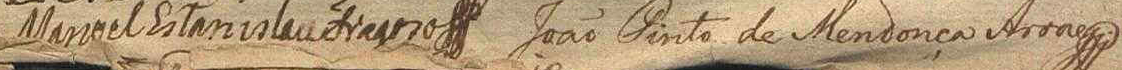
Manoel Estanislau Fragoso Joaõ Pinto de Mendonça Arraes
